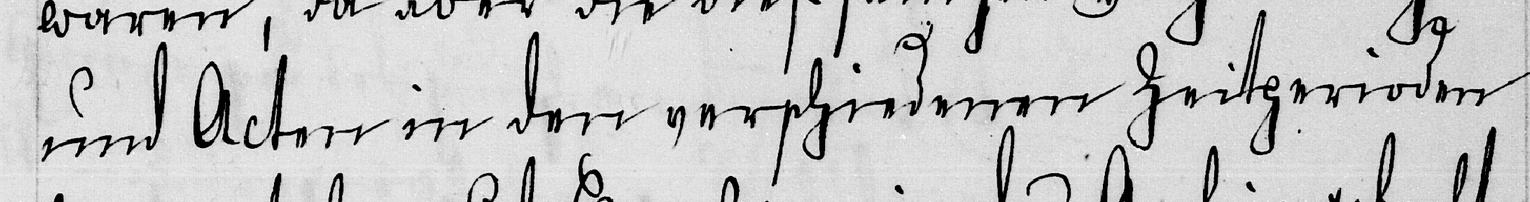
und Acten in den verschiedenen Zeitperioden
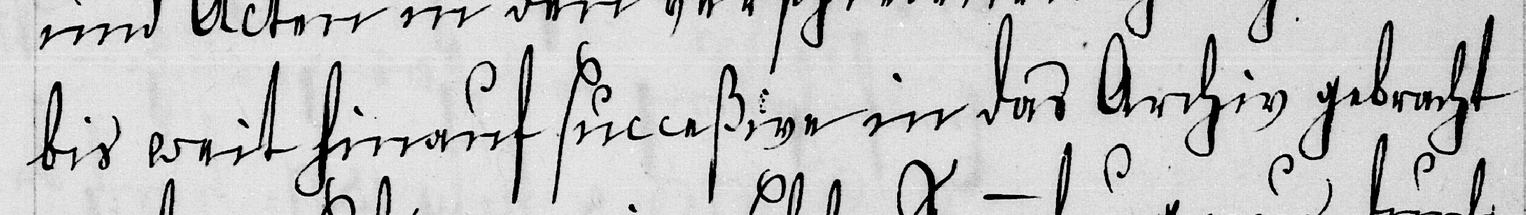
bis weit hinauf succeßive in das Archiv gebracht
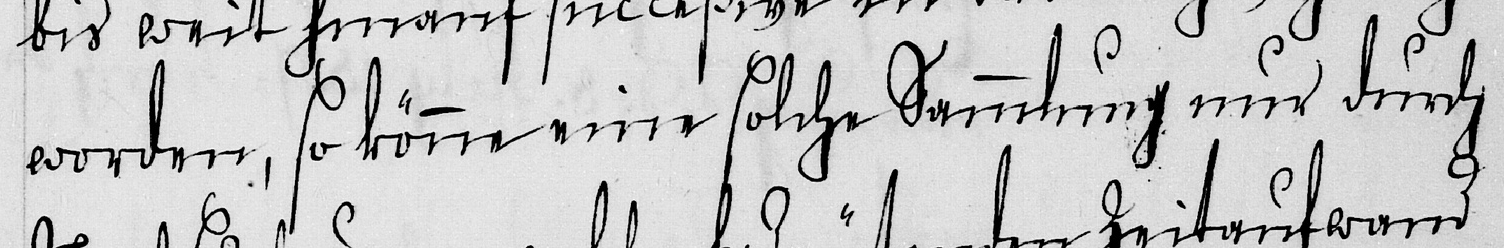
worden, so könne eine solche Sammlung nur durch
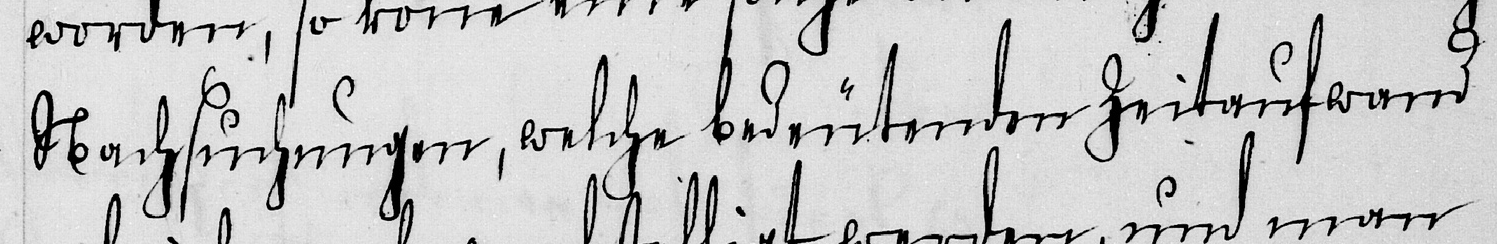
Nachsuchungen, welche bedeutenden Zeitaufwand
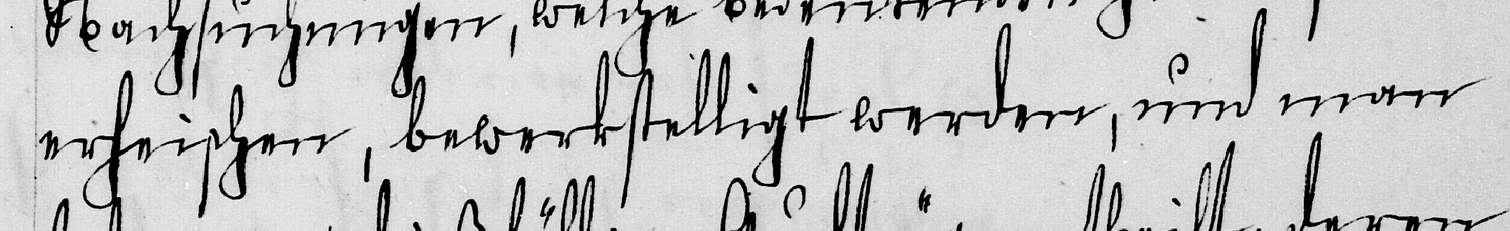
erheischen, bewerkstelligt werden, und man
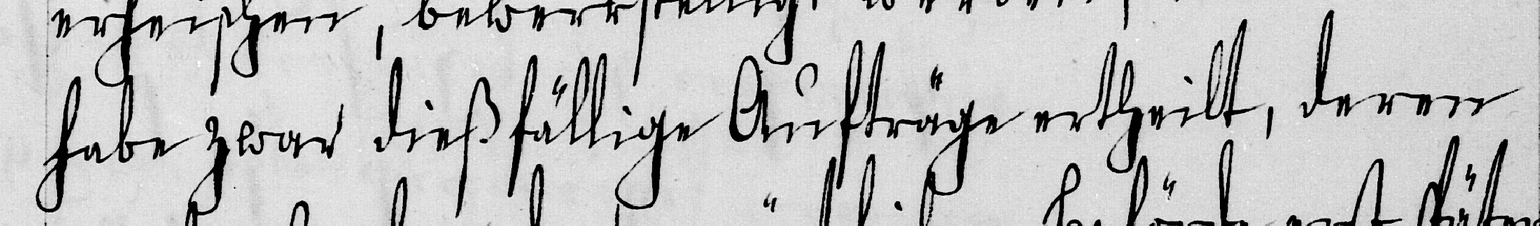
habe zwar dießfällige Aufträge ertheilt, deren
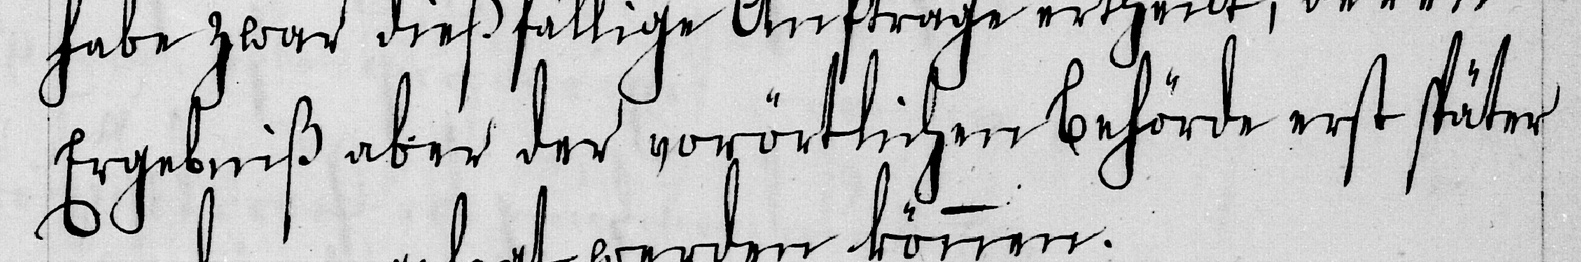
Ergebniß aber der vorörtlichen Behörde erst später
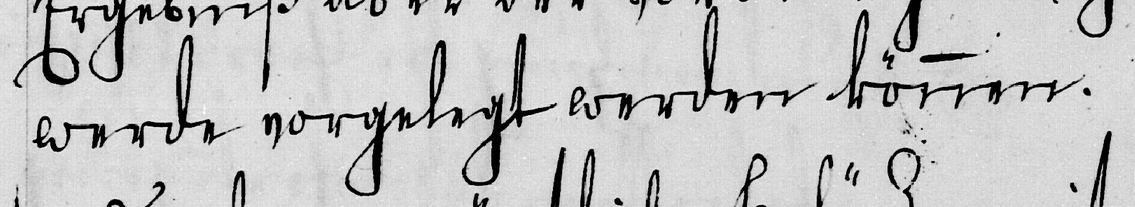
werde vorgelegt werden können.
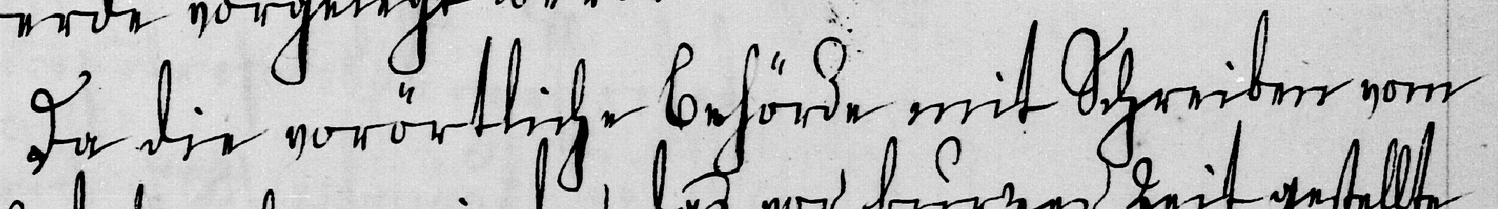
Da die vorörtliche Behörde mit Schreiben vom
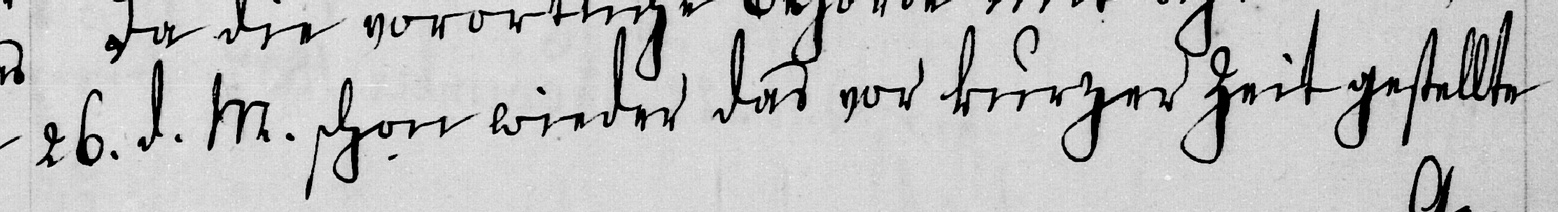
26. d. M. schon wieder das vor kurzer Zeit gestellte
